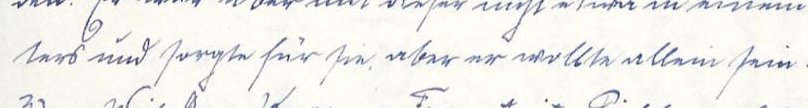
ter d und sorgte für sie aber er wollte allein sein...
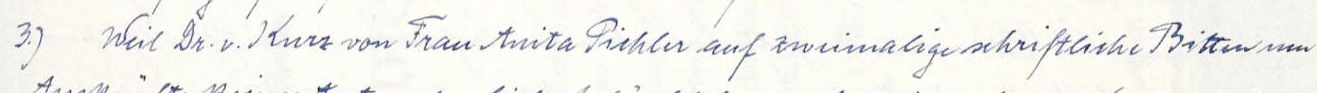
3) Weil Dr. v. Kurz von Frau Anita Pichler auf zweimalige schrifliche Bitte um
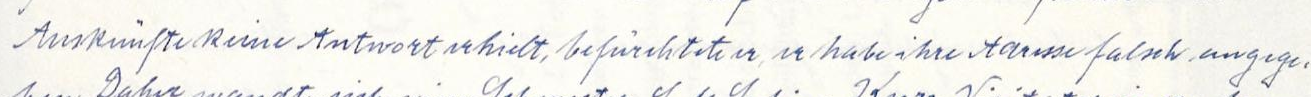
Auskünfte keine Antwort erhielt, befürchtete er, er habe ihre Adresse falsch ange-
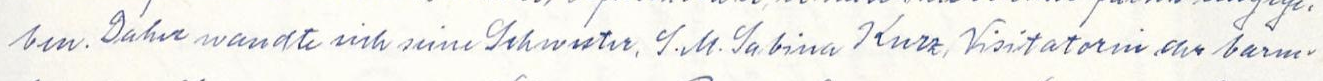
ben. Daher wandte auch seine Schwester, S. M. Sabina Kurz, Visitatorin der barm-
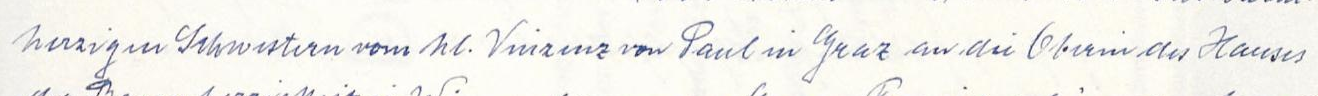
herzigen Schwestern von hl. Vinzenz von Paul in Graz an die Oberin des Hauses
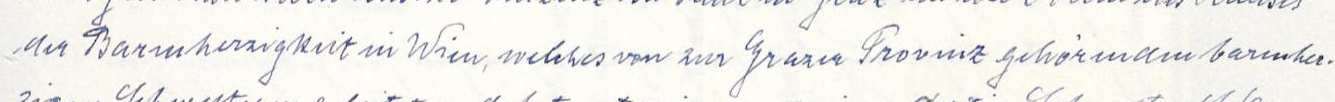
der Barmherzigkeit in Wien, welches von zur Grazer Provinzt gehörenden barm-
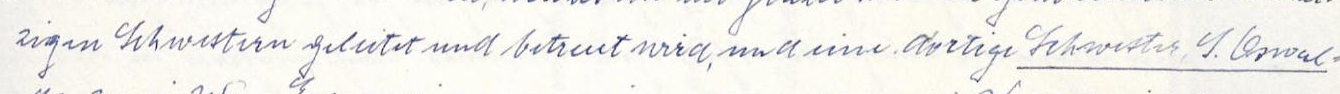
herzigen Schwestern geleitet und betreut wird, und eine dortige Schwester, S. Oswal-
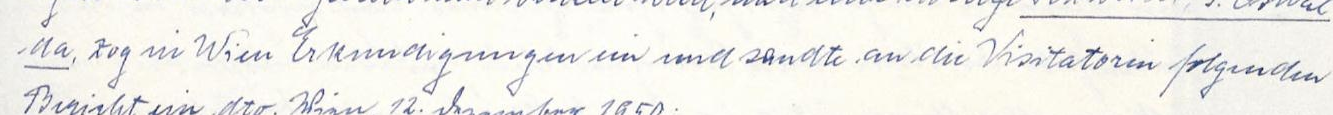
da, zog in Wien Erkundigungen ein und sandte an die Visitatorin folgenden
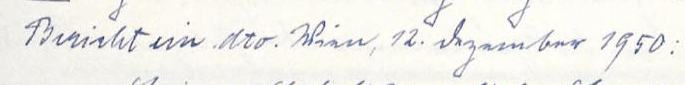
Bericht ein dsto. Wien, 12. Dezember 1950:
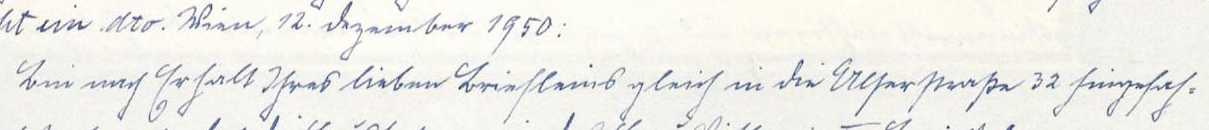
Bin nach Erhalt Ihres lieben Briefleins gleich in die Alserstraße 32 hingefah-
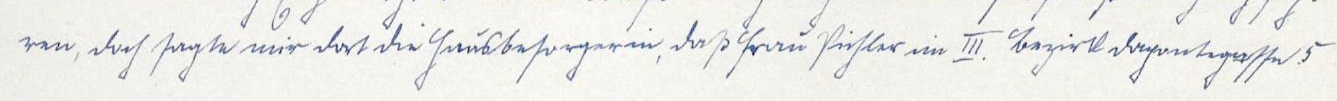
ren, doch sagte mir dort die Hausbesorgerin, das Frau Pichler im III. Bezirk Dapontegasse 5
